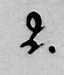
2.
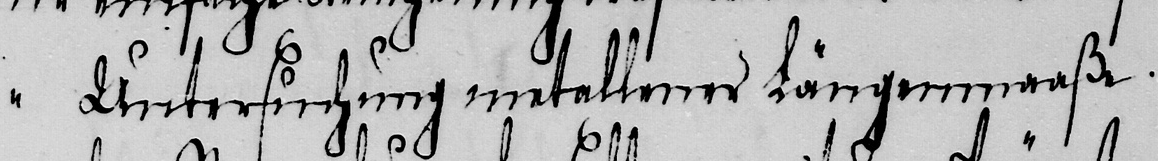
Untersuchung metallener Längenmaaße
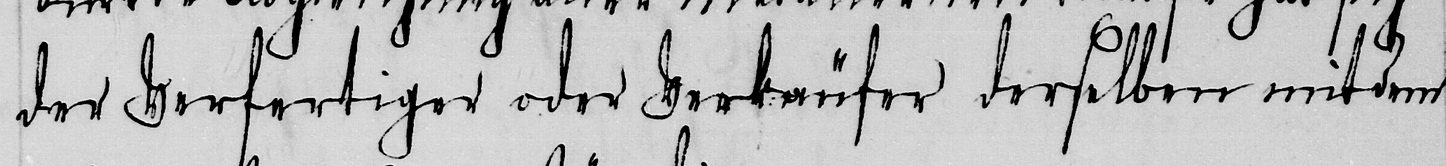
der Verfertiger oder Verkäufer derselben mit dem
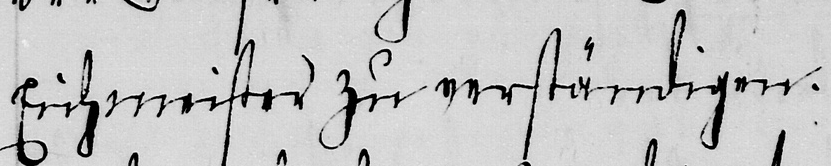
Eichmeister zu verständigen.
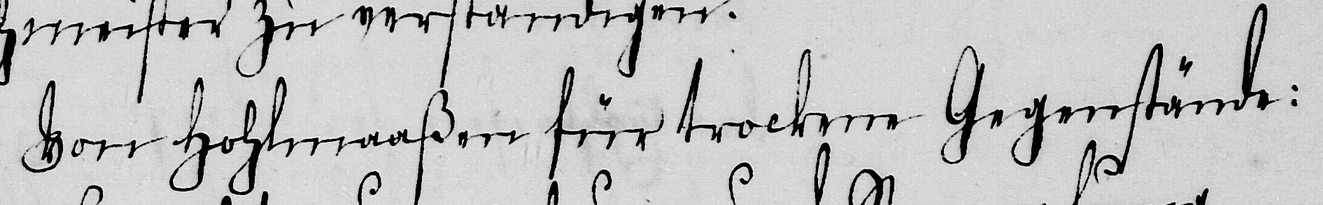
Von Hohlmaßen für trockene Gegenstände:
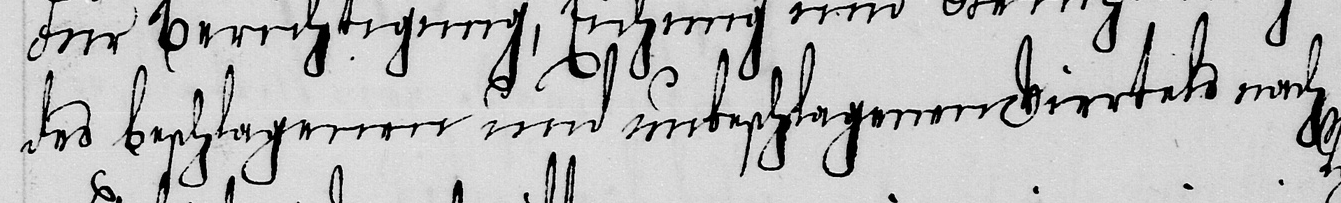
des beschlagenen und unbeschlagenen Viertels nach
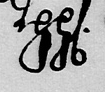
dto.
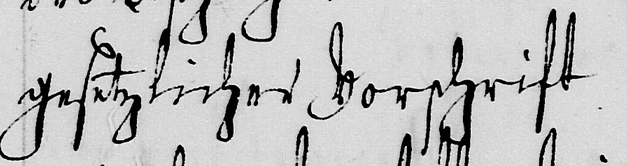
gesetzlicher Vorschrift
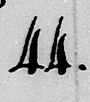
44.
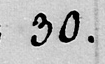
30.
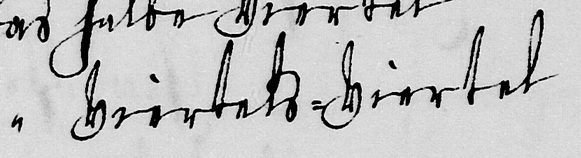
“ Viertels-Viertel
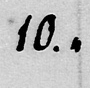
18.
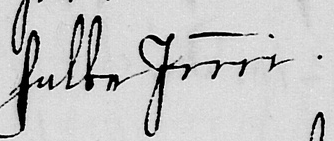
halbe Inni
